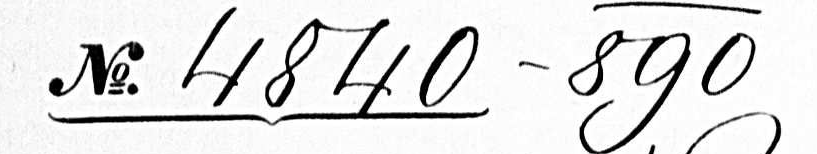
No. 4840 - 890
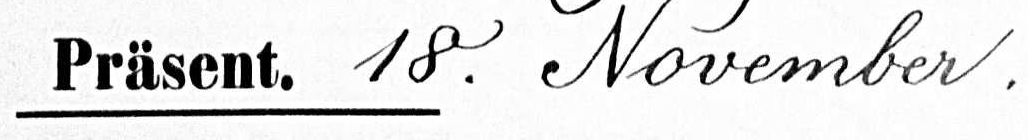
Präsent. 18. November.
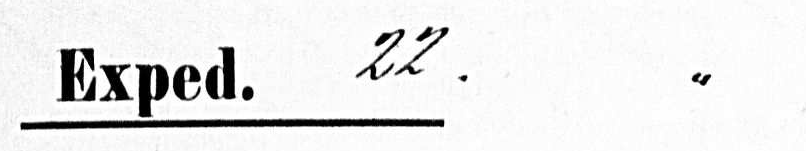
Exped. 22. November.
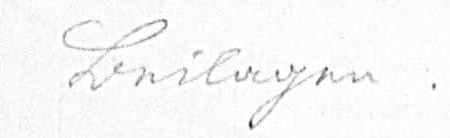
Beilagen.
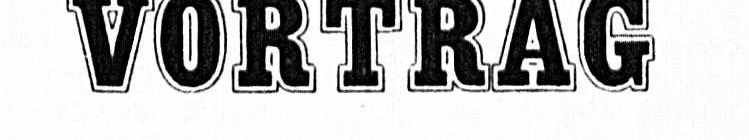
Vortrag
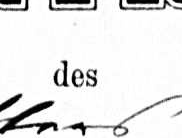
des
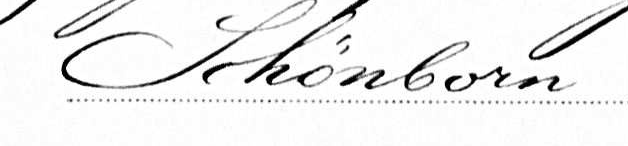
Schönborn
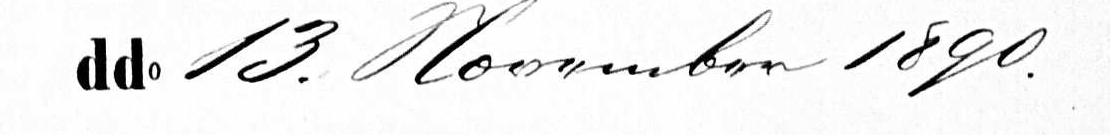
ddo 13. November 1890.
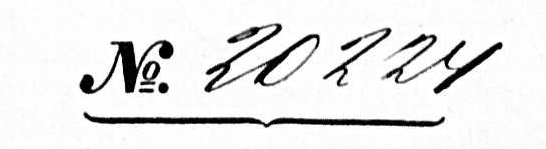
No. 20224
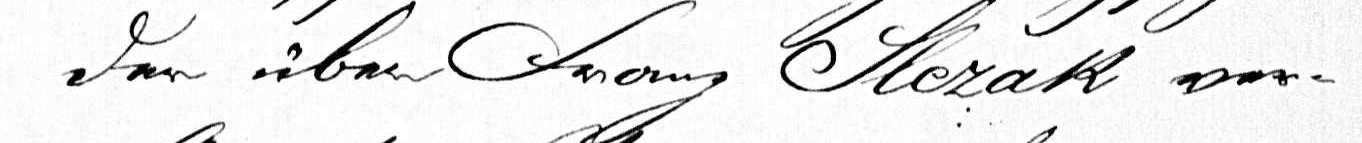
der über Franz Slezak ver
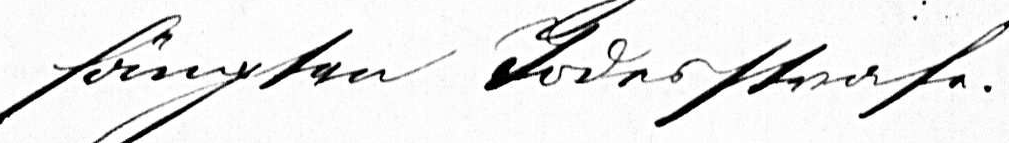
hängten Todesstrafe.
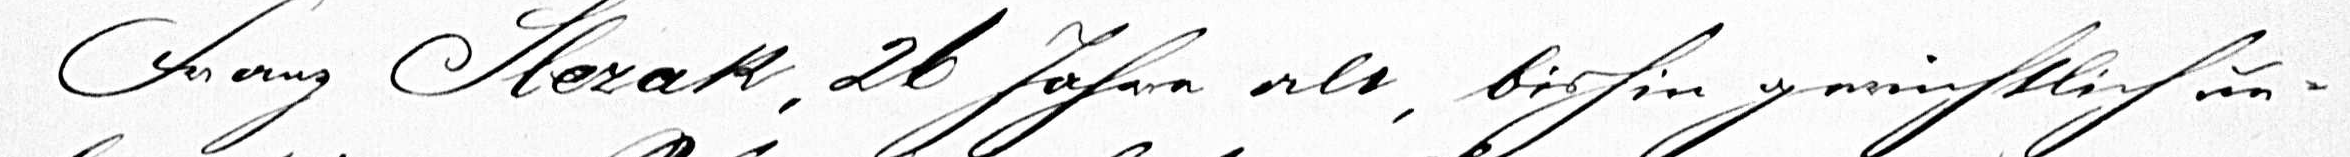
Franz Slezak, 26 Jahre alt, xx gerichtlich un¬
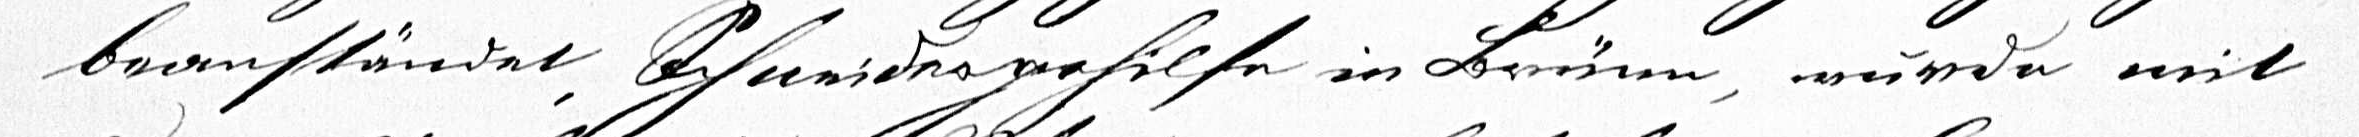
beanständet, Schneidergehilfe in Brünn, wurde mit
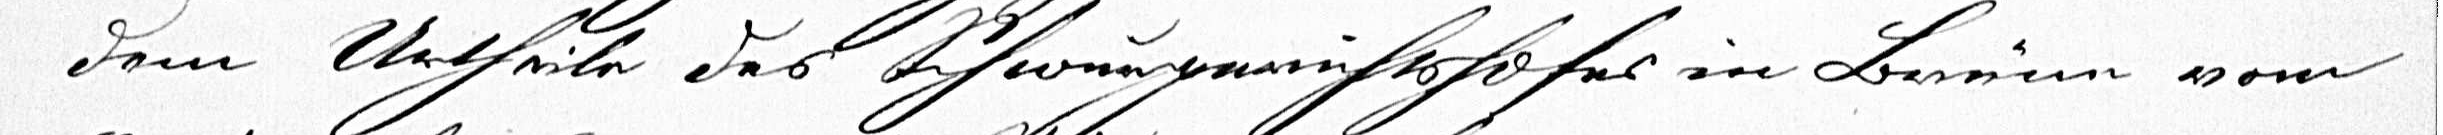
dem Urtheile des Schwurgerichtshofes in Brünn vom
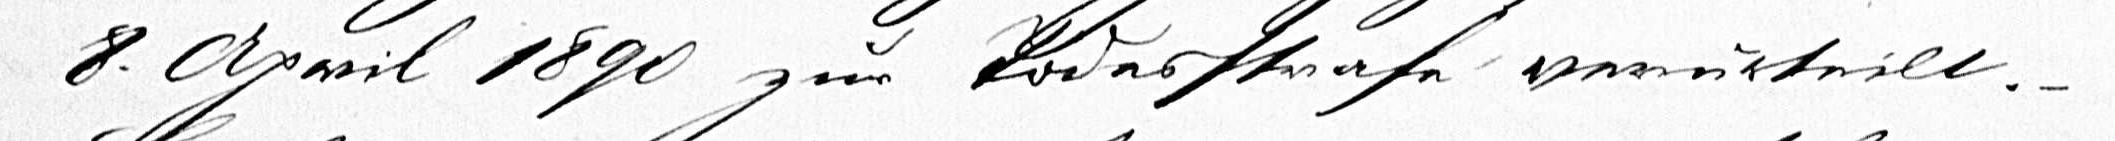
8. April 1890 zur Todesstrafe verurtheilt.-
